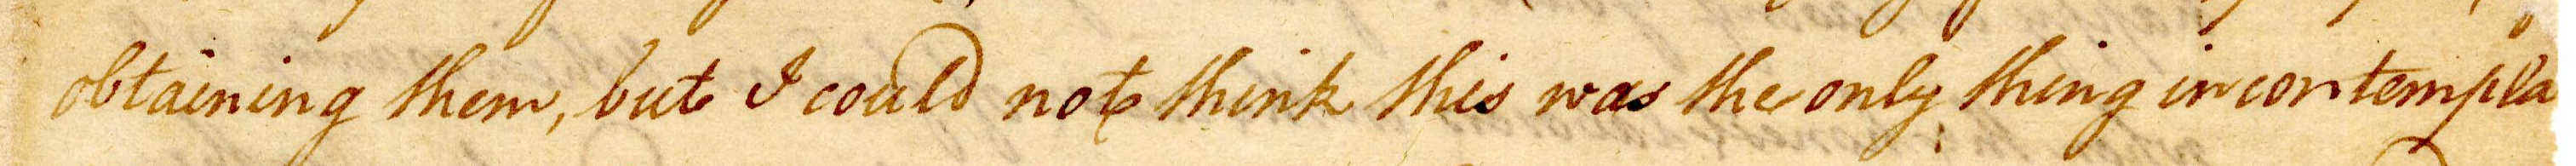obtaining them, but I could not think this was the only thing in contempla-
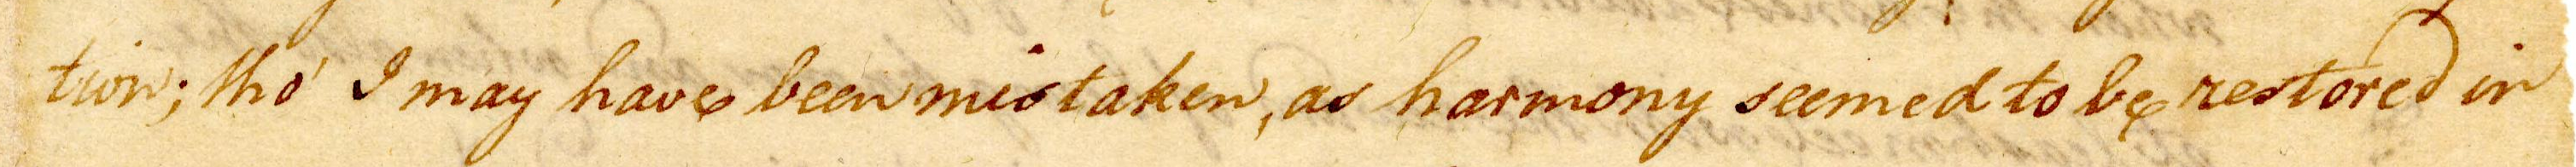tion; tho' I may have been mistaken, as harmony seemed to be restored in
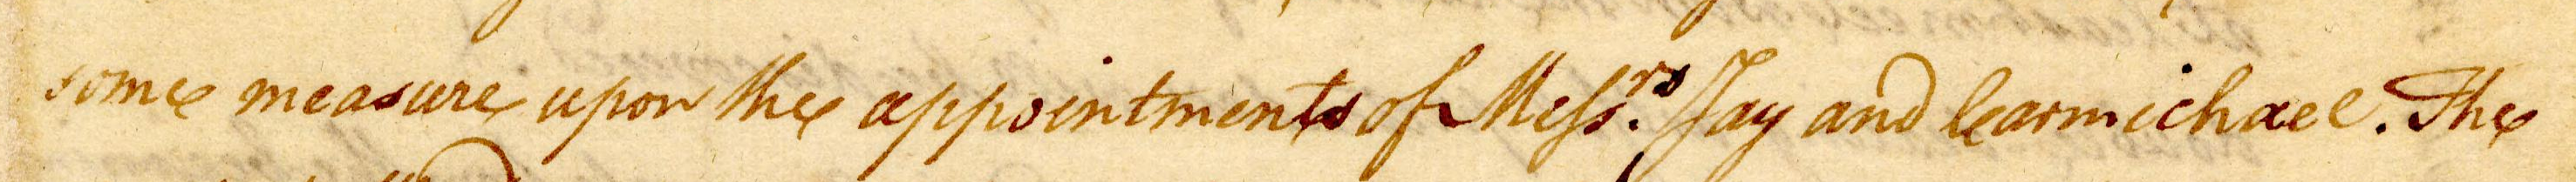some measure upon the appointments of Mess^rs. Jay and Carmichael. The
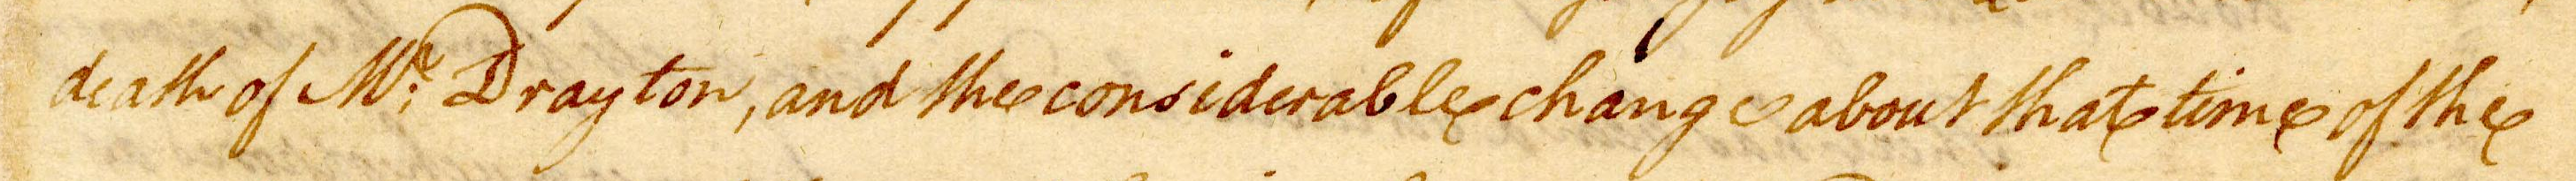death of M^r. Drayton, and the considerable change about that time of the
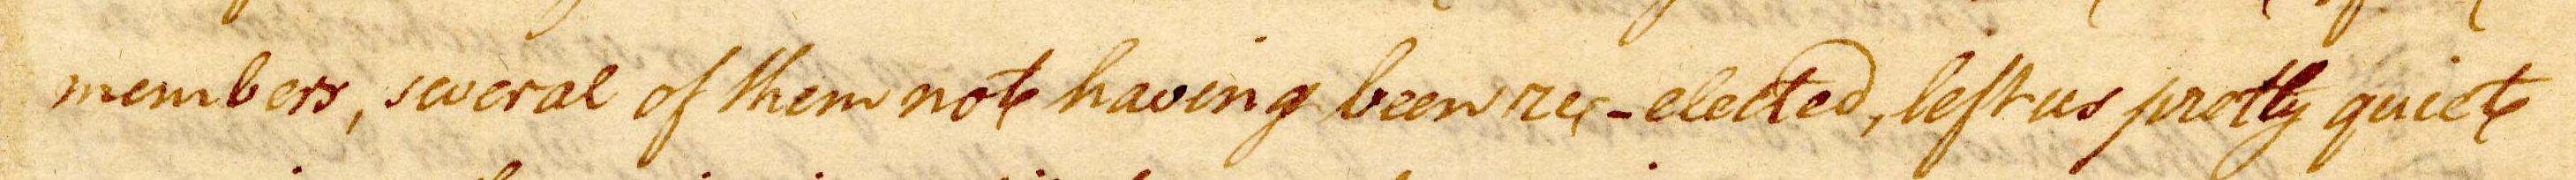members, several of them not having been re-elected, left us firstly quiet
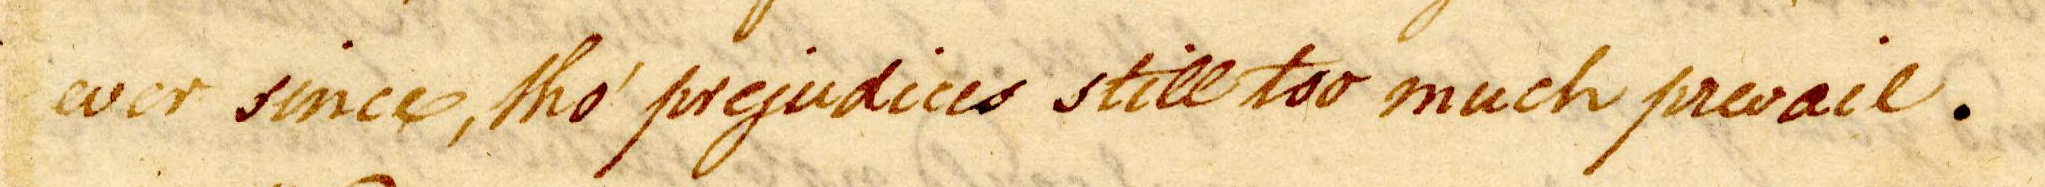ever since, tho' prejudices still too much prevail.
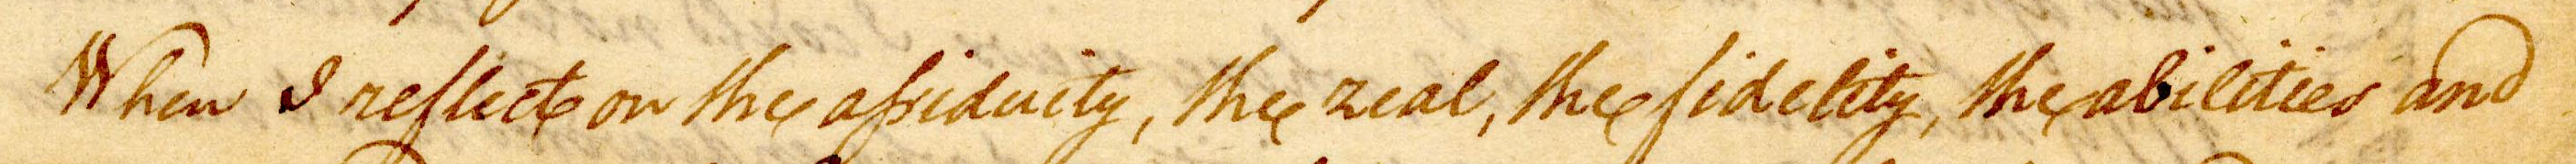When I reflect on the assiduity, the real, the fidelity, the abilities and
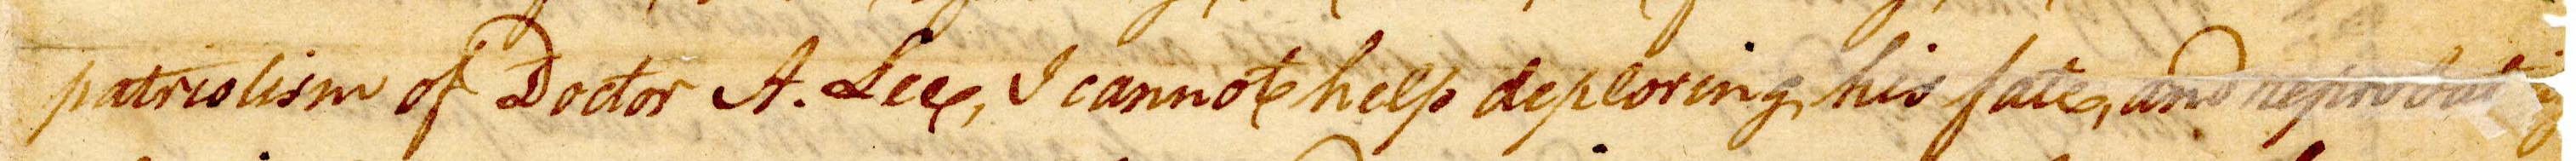patriotism of Doctor A. Lee, I cannot help deploring his fate, and reprobuting
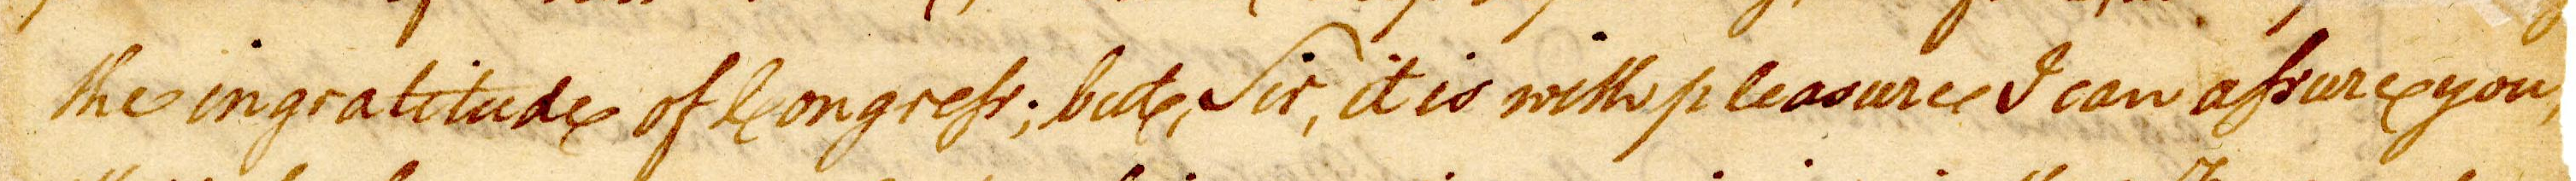the ingratitude of Congress; but Sir, it is with pleasure I can assure you
